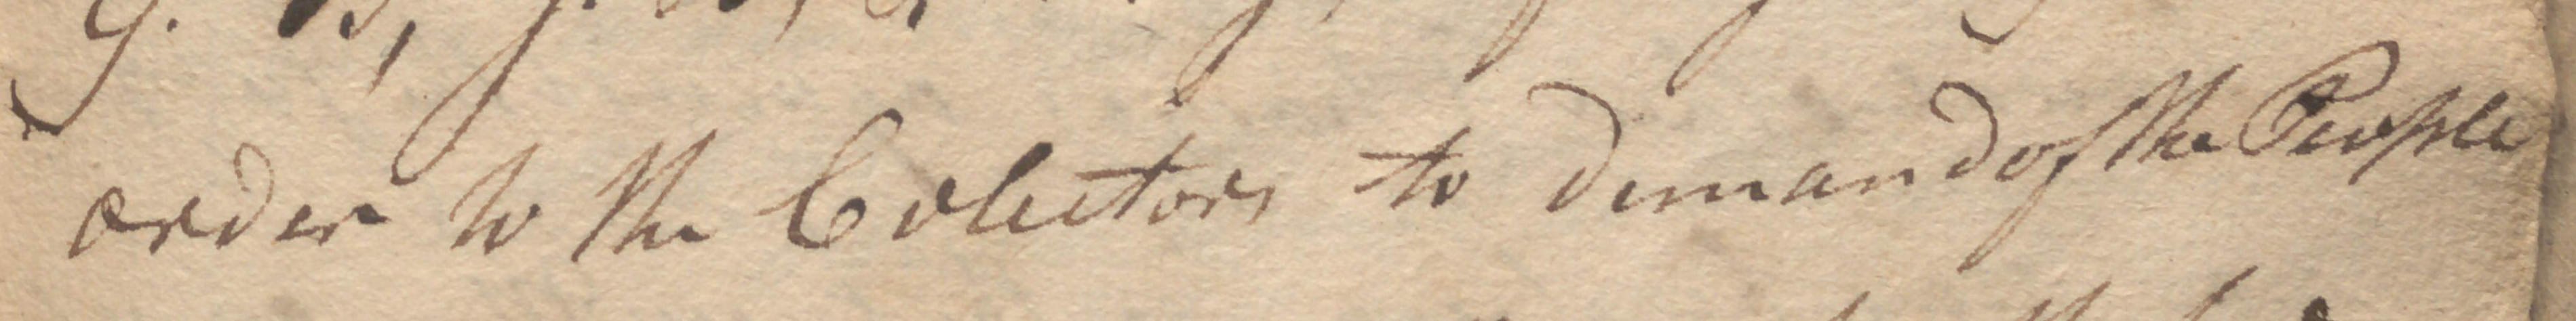order to the Colectors to demand of the People
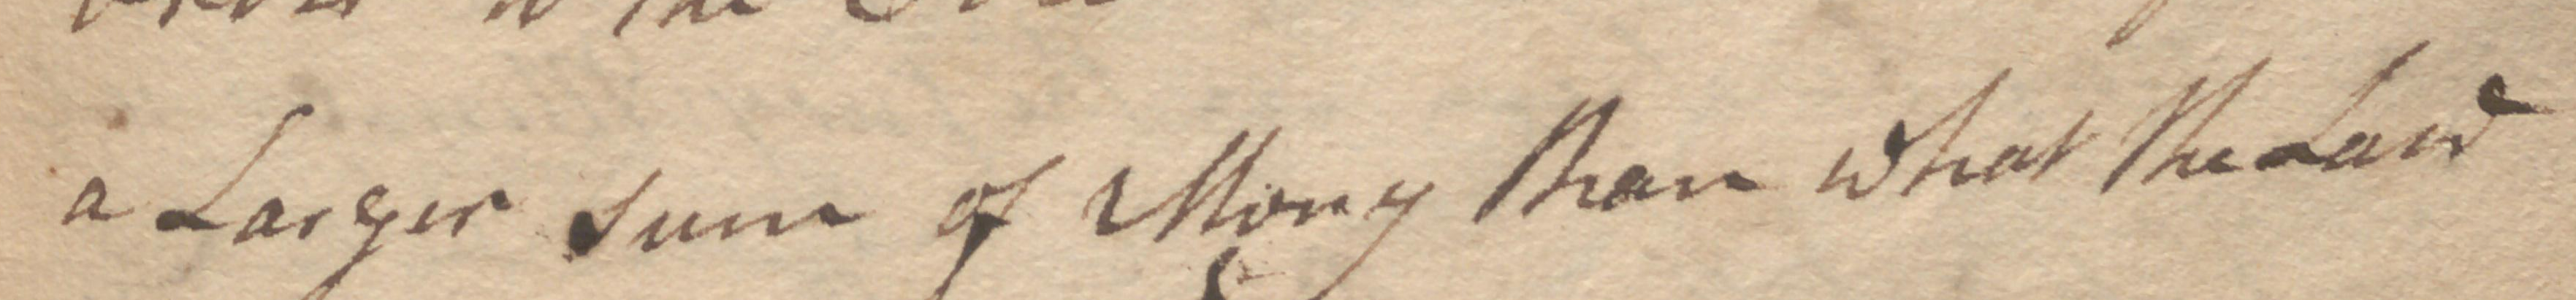a Larger sum of Mony than what the Law
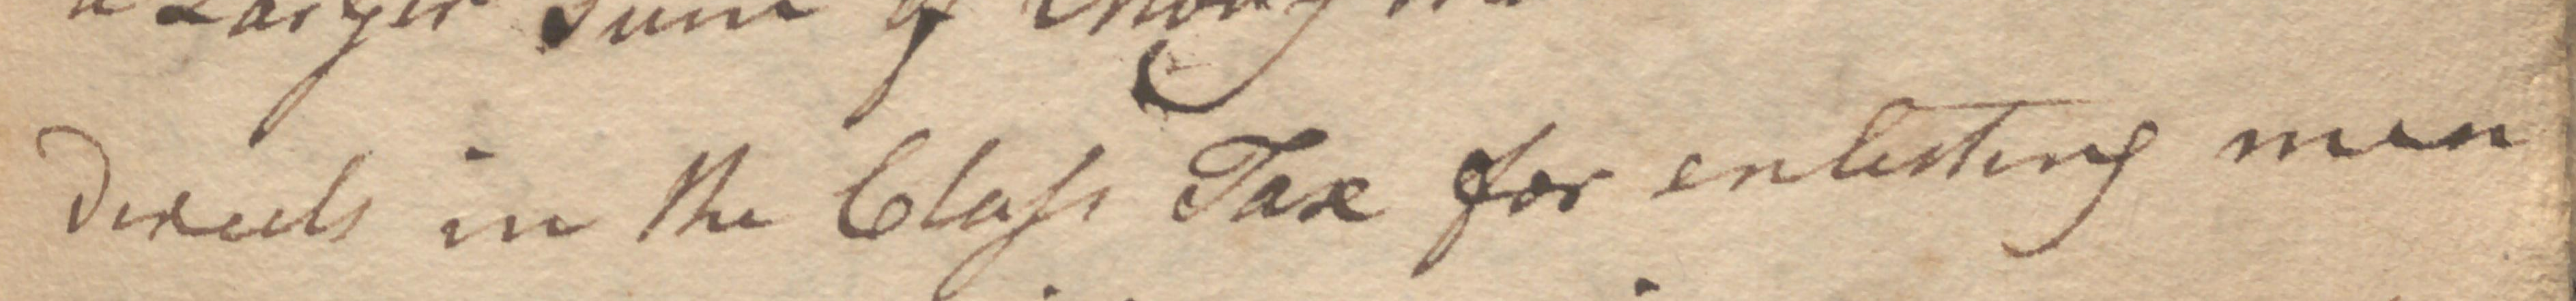directs in the Class Tax for enlisting men
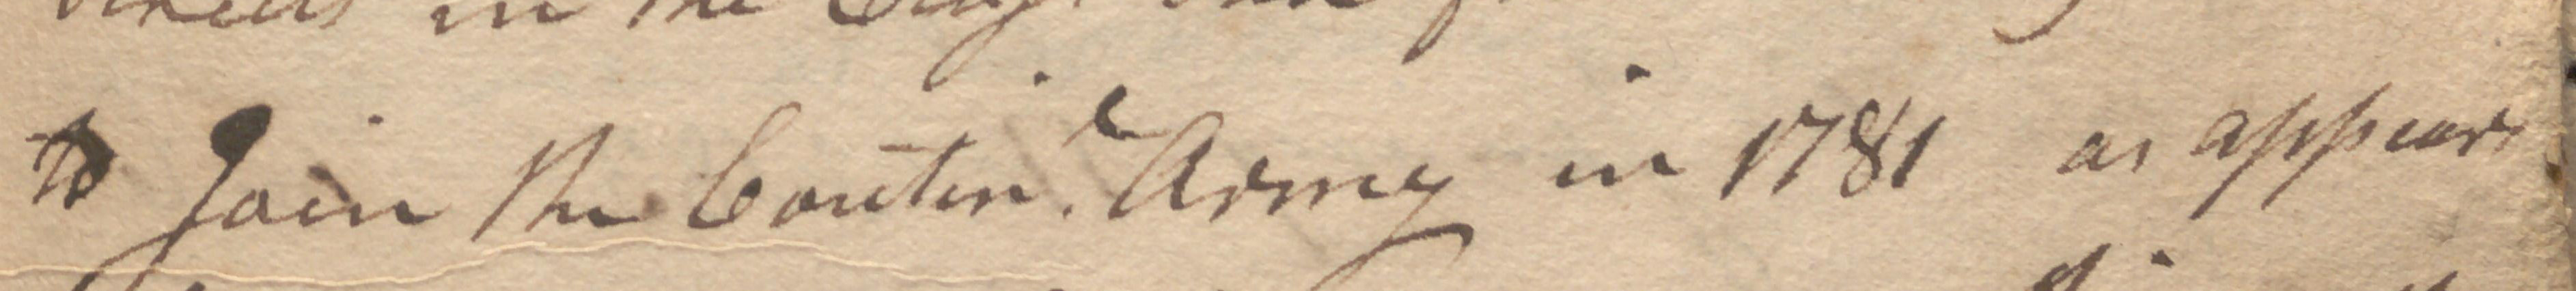to Join the Contin^l. Army in 1781 as appears
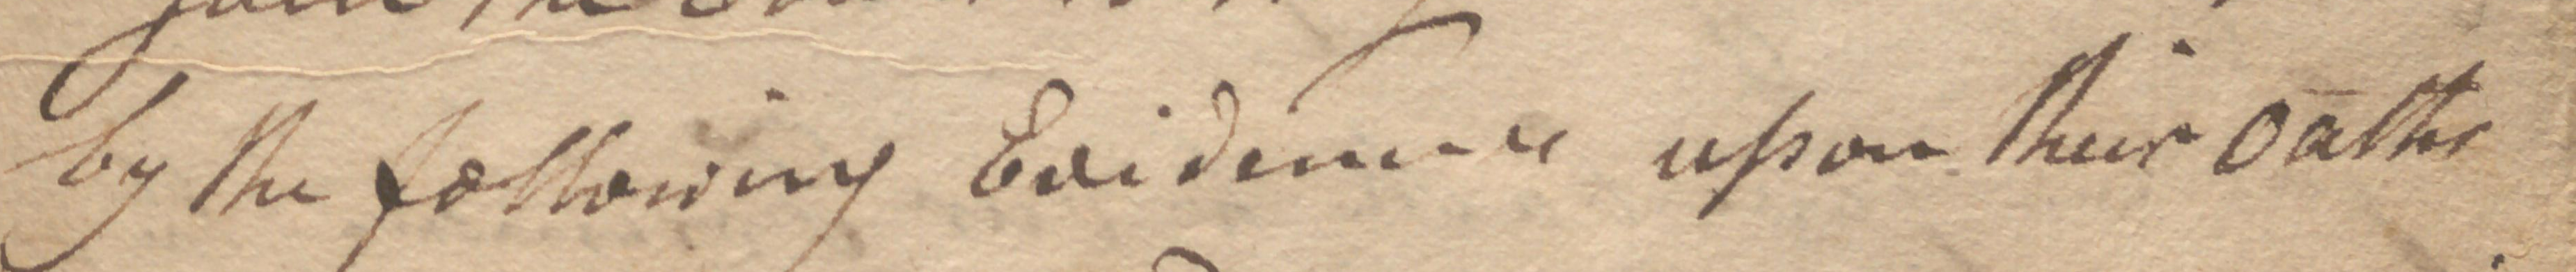by the following Evidences upon their oaths
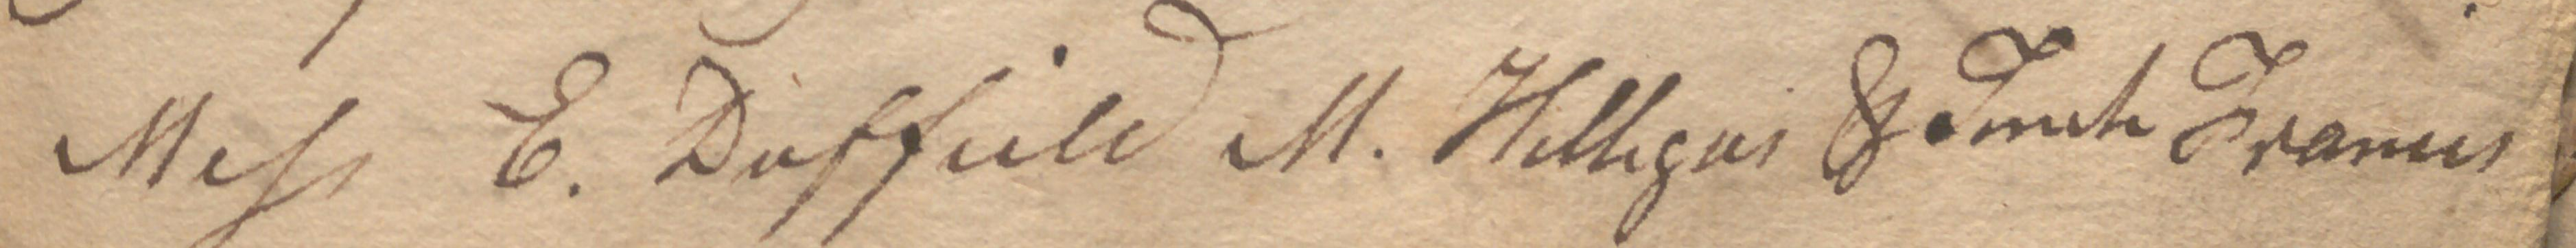Mess E. Duffield M. Hilligas & Tench Frances
